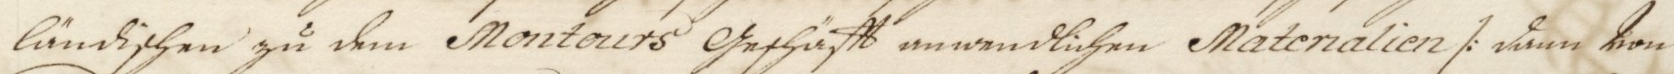ländischen zu dem Montours-Geschäfft anwendlichen Materialien (dann von
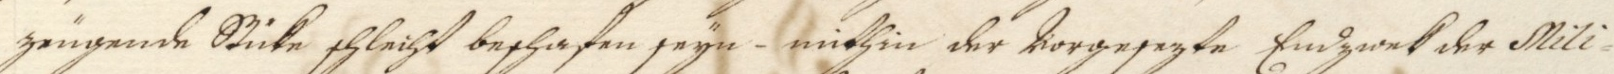zeügende Stüke schlecht beschafen seyn — mithin der vorgesezte Endzwek der Mili-
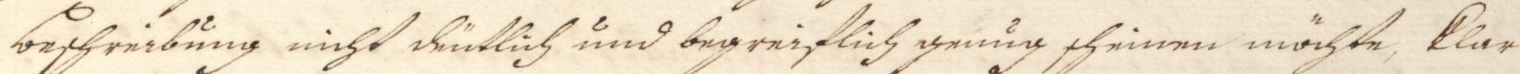Beschreibung nicht deütlich und begreiflich genug scheinen möchte, klar
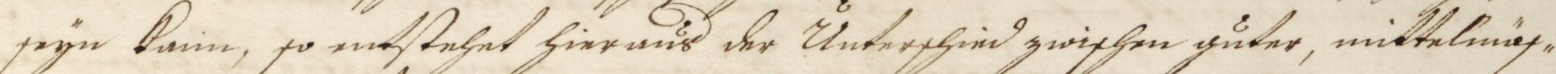seyn kann, so entstehet hieraus der Unterschied zwischen guter, mittelmäs-
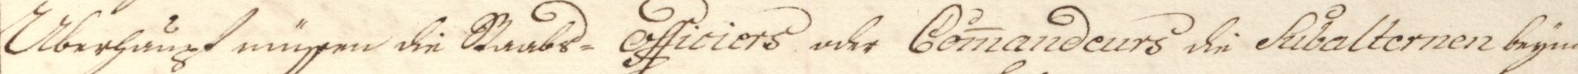Überhaupt müssen die Staabs-Officiers oder Commandeurs die Subalternen beym
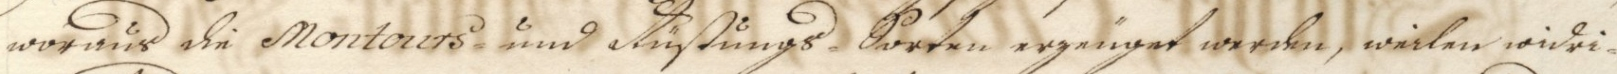woraus die Montours- und Rüstungs-Sorten erzeüget werden, weilen widri-
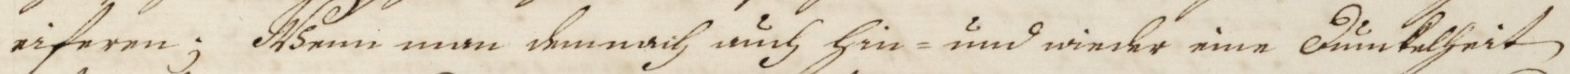eiferen. Wenn man demnach auch hin- und wieder eine Dunckelheit
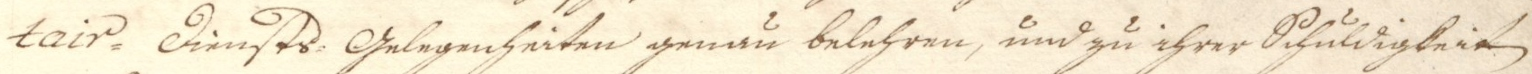tair- Diensts- Gelegenheiten genau belehren, und zu ihrer Schuldigkeit
